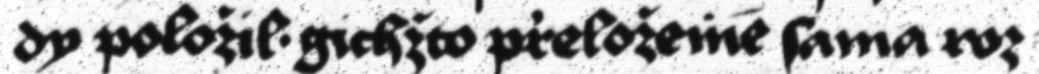dy položil gichžto pṙeložeṅíe ſama roz
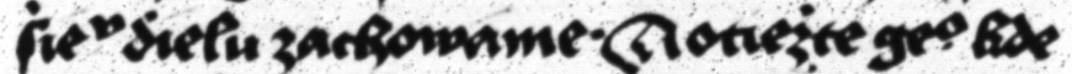ẛiev ḋíelu zachowáme. A otiežte ge° kde
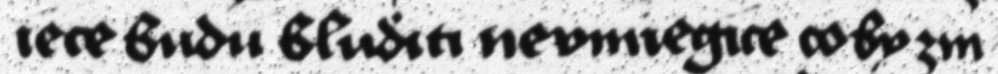íece budú bluḋiti nevmiegíce co by zni
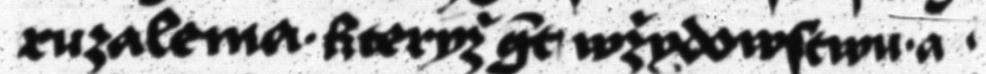ruzalema. kterýž ḡt wžydowſtwu. a
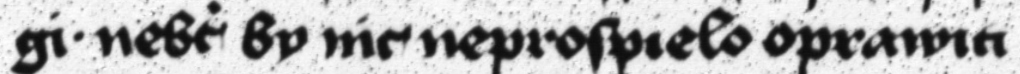gi. nebṫ by nic neproſpielo oprawiti
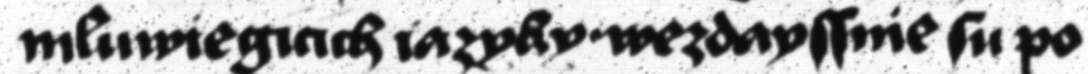mluwiegících iazyky. wezdayſſnie ſu po
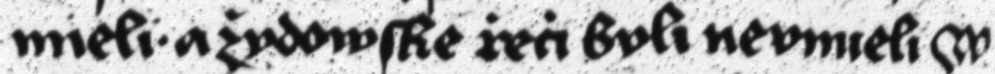mieli. a žydowſke ṙeċi byli nevmieli W
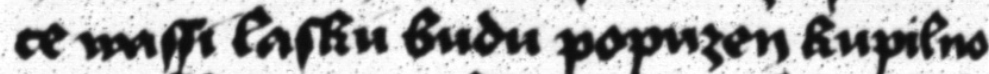ce waſſí laſkú budu popuzen kupilno
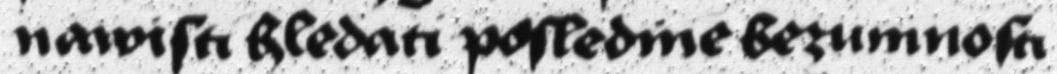nawiſti hledati poſledṅíe bezumnoſti
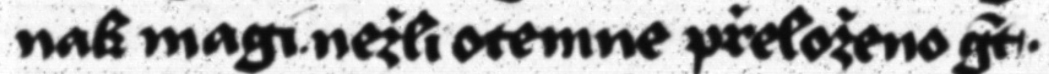nak magí. nežli otemne přeloženo ḡt.
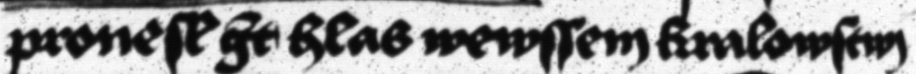proneſl ḡt hlas wewſſem kaalowſtwí
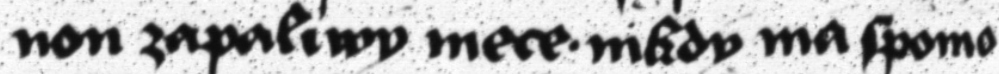non zapaliwy mece. nikdú ma ſpomo
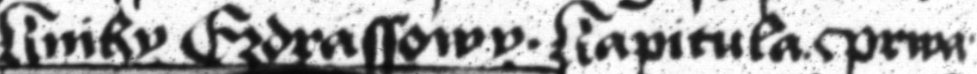Knihy Ezdráſſowy. Kapitula Prwá.
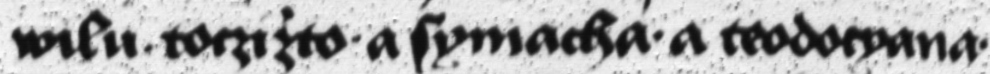wilu. toczíżto. a ſymacha. a teodotyana.
